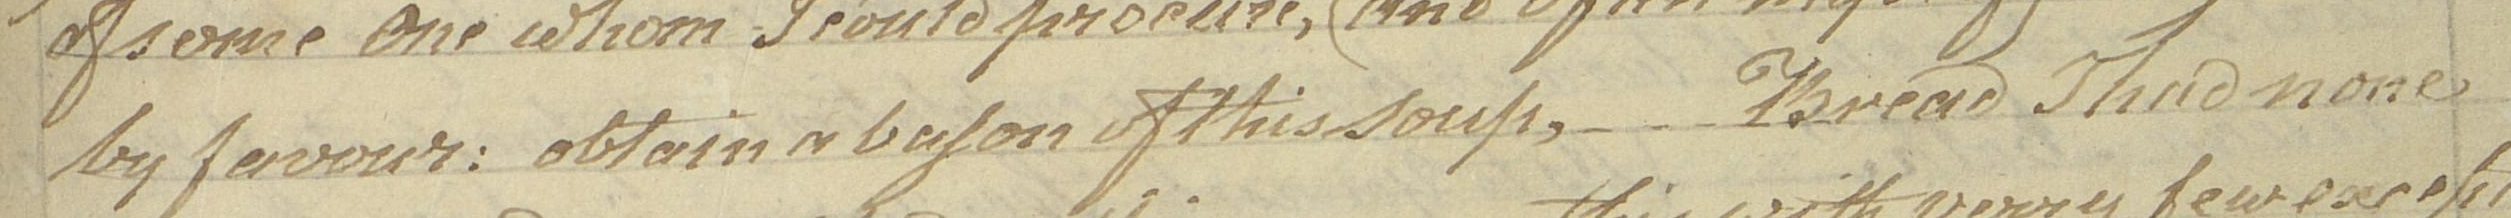by favour: obtain a bason of this soup, Bread I had none
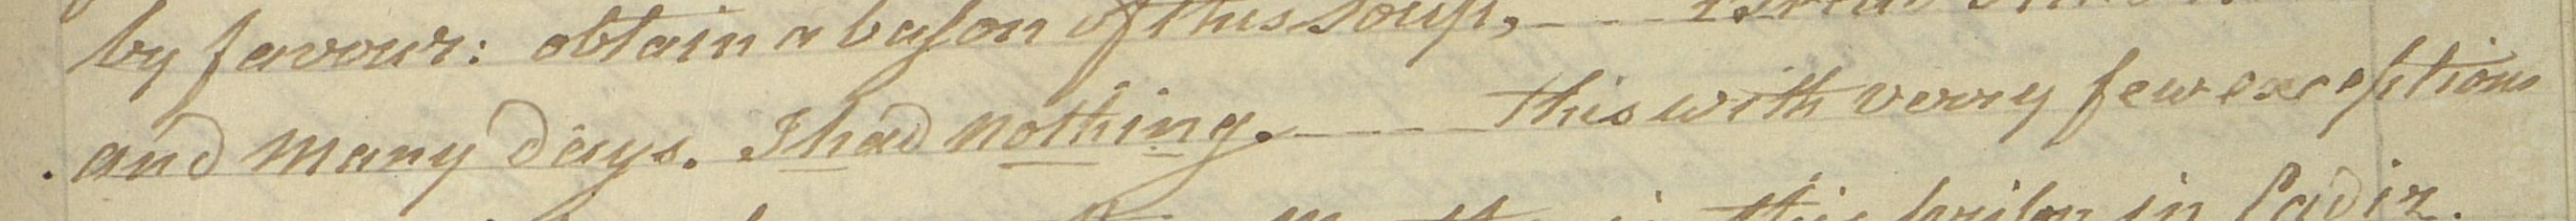and Many days. I had nothing. This with verry few exceptions
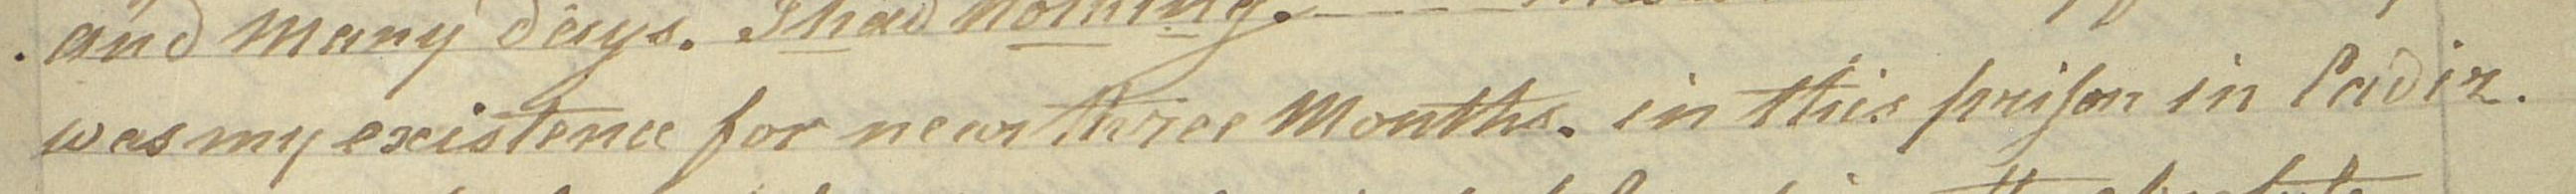was my existence for near three Months. in this prison in Cadiz.
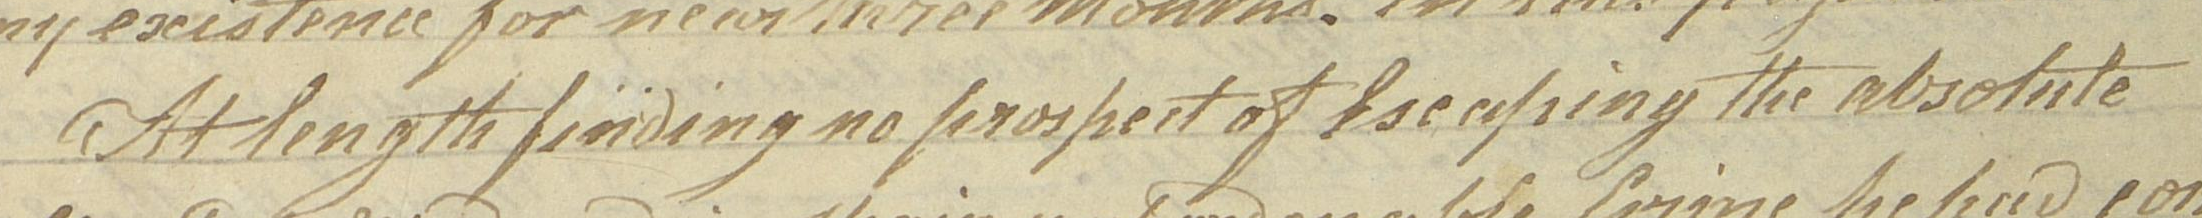At length finding no prospest of Escaping the absolute
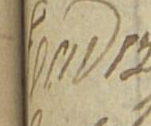Cadiz
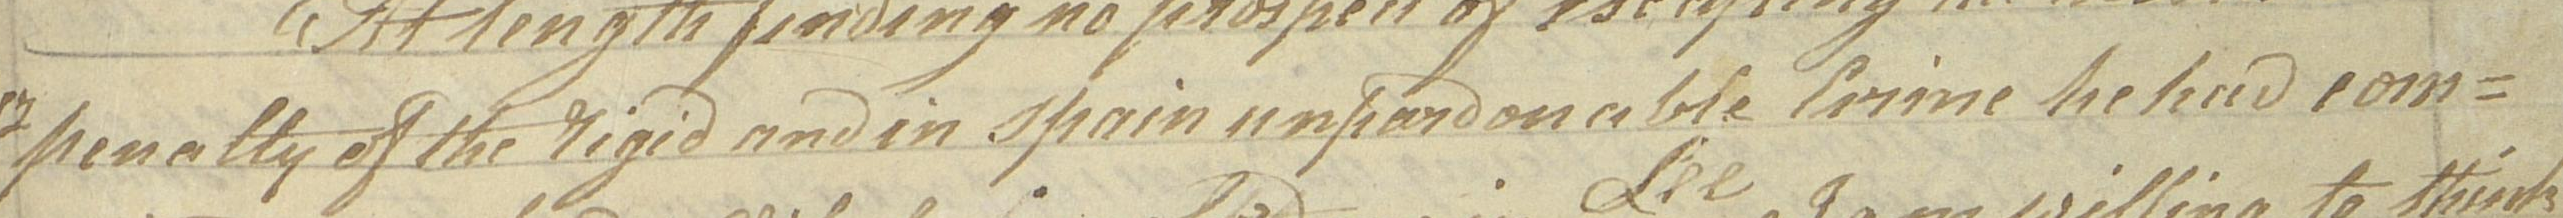penalty of the rigid and in Spain unpardonable Crime he had com-
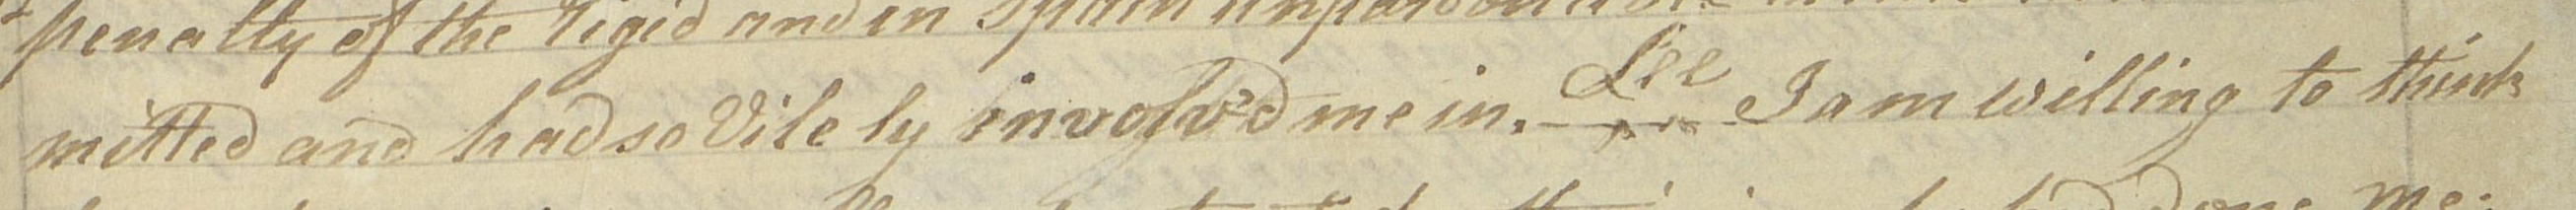-mitted and had so Vilely involv'd me in. ^ I am willing to think
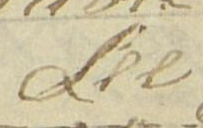Lee
